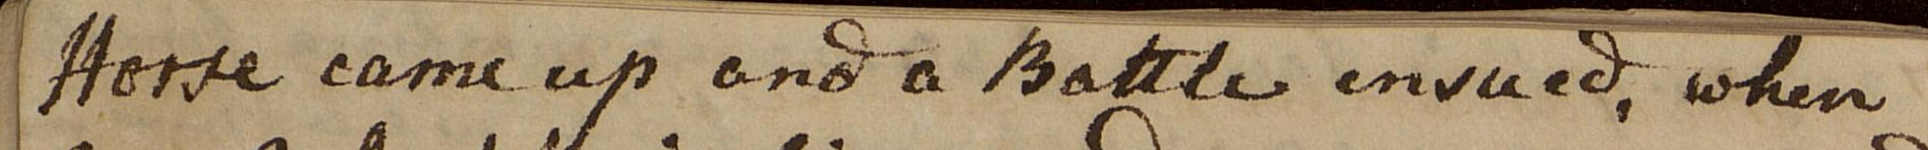Horse came up and a Battle ensued, when
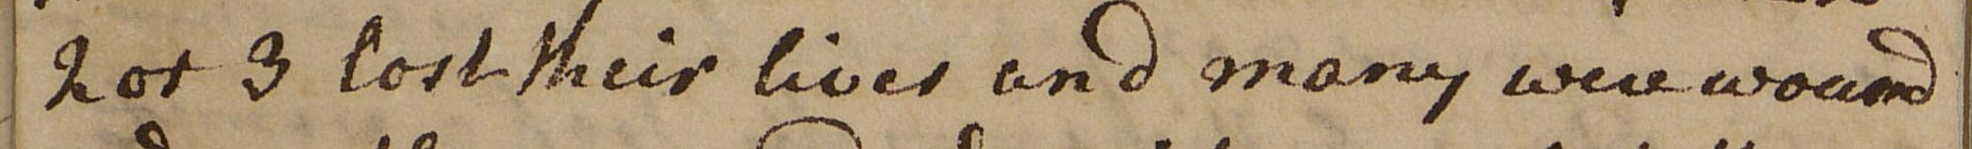2 or 3 lost their lives and many were wound
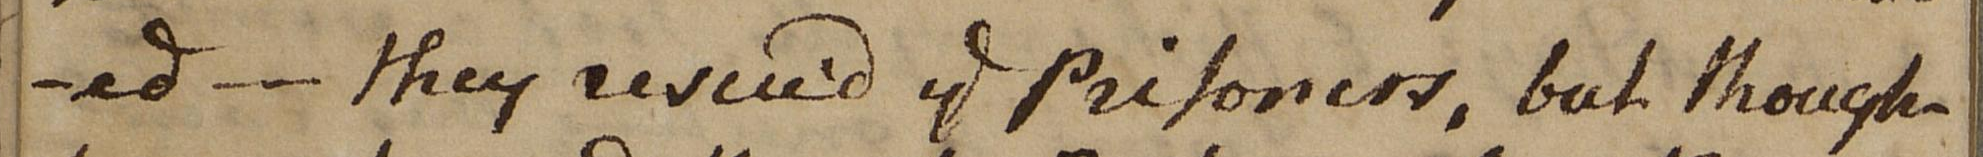-ed- they rescu'd y^e Prisoners, but though
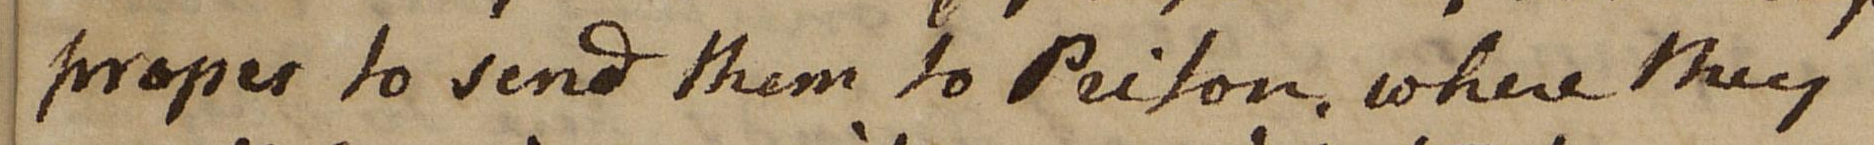proper to send them to Prison, where they
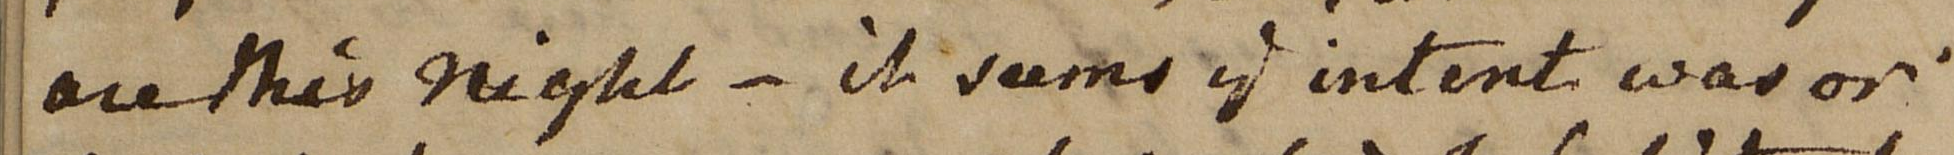are this Night- it seems y^e intent was or
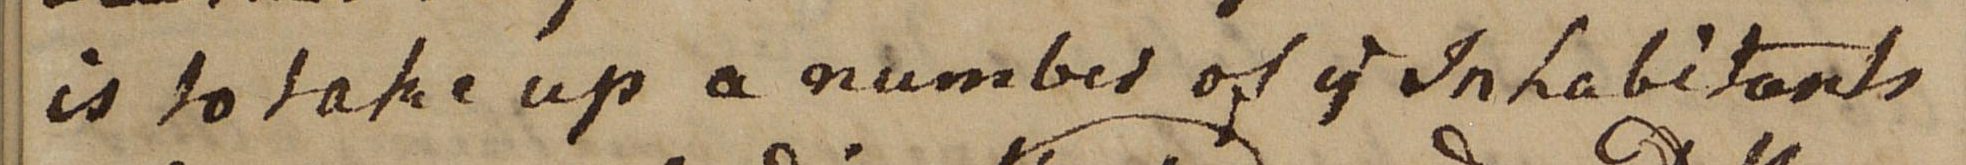is to take up a number of y^e Inhabitants
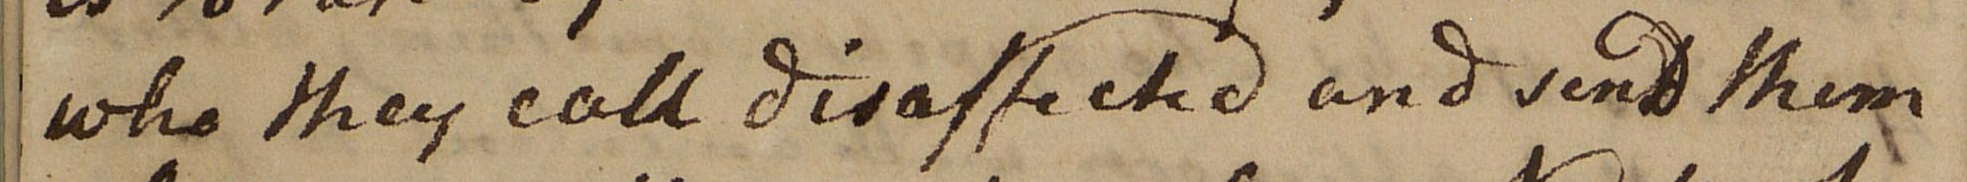who they call disaffected and send them
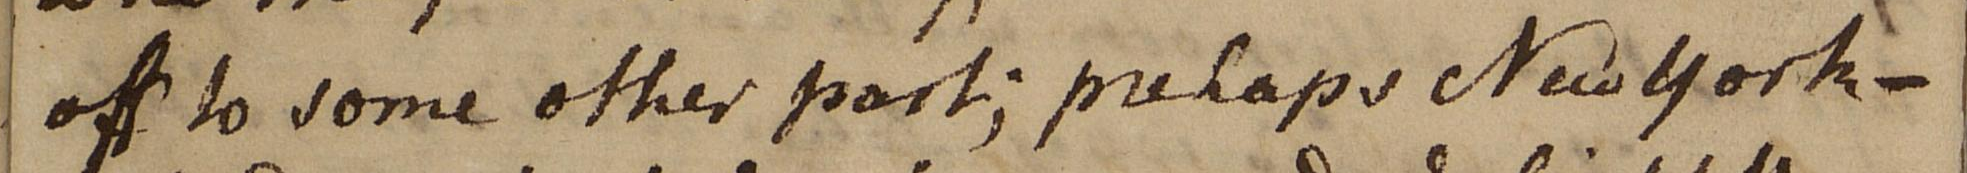off to some other part; prehaps New York-
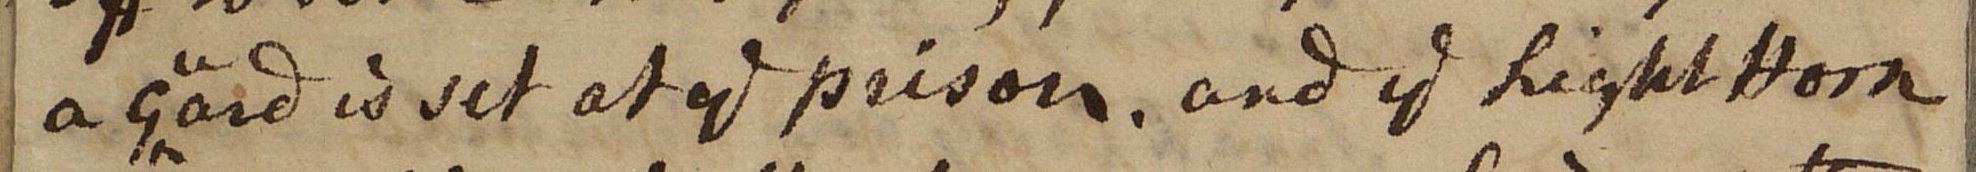a G^uard is set at y^e prison, and y^e hight Horn
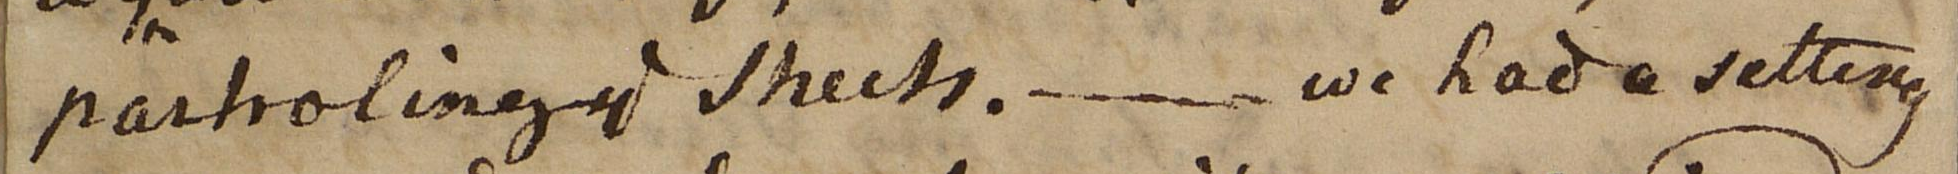partroling y^e streets.- we had a setting
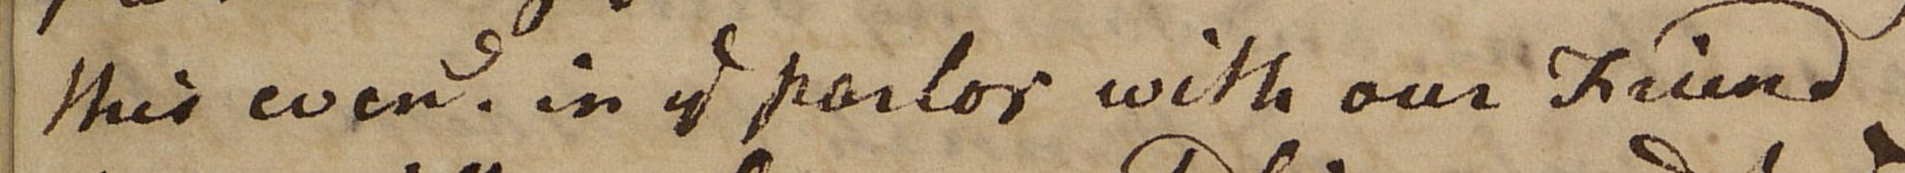this even^g. in y^e parlor with our Friend
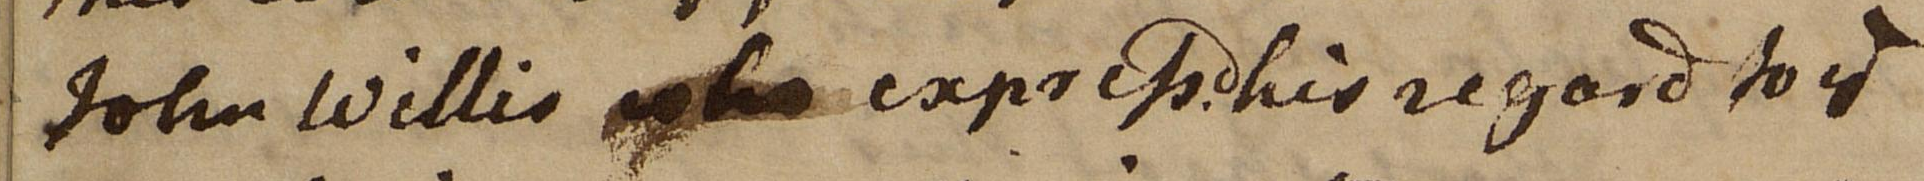John Willis who express^d. his regard to y^e
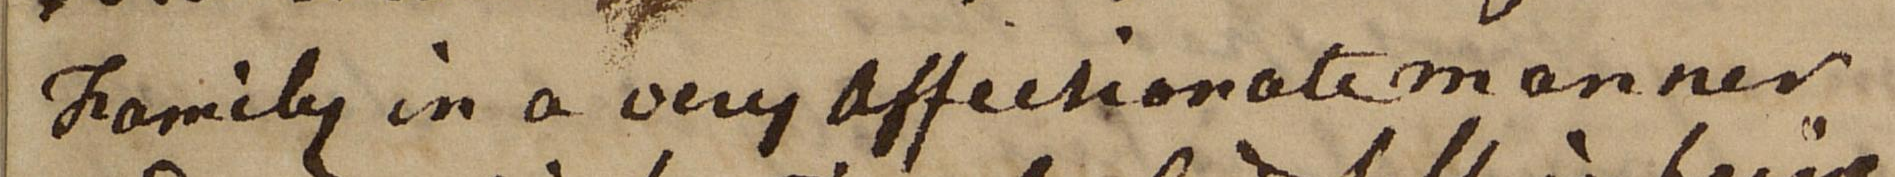Family in a very affectionate manner
